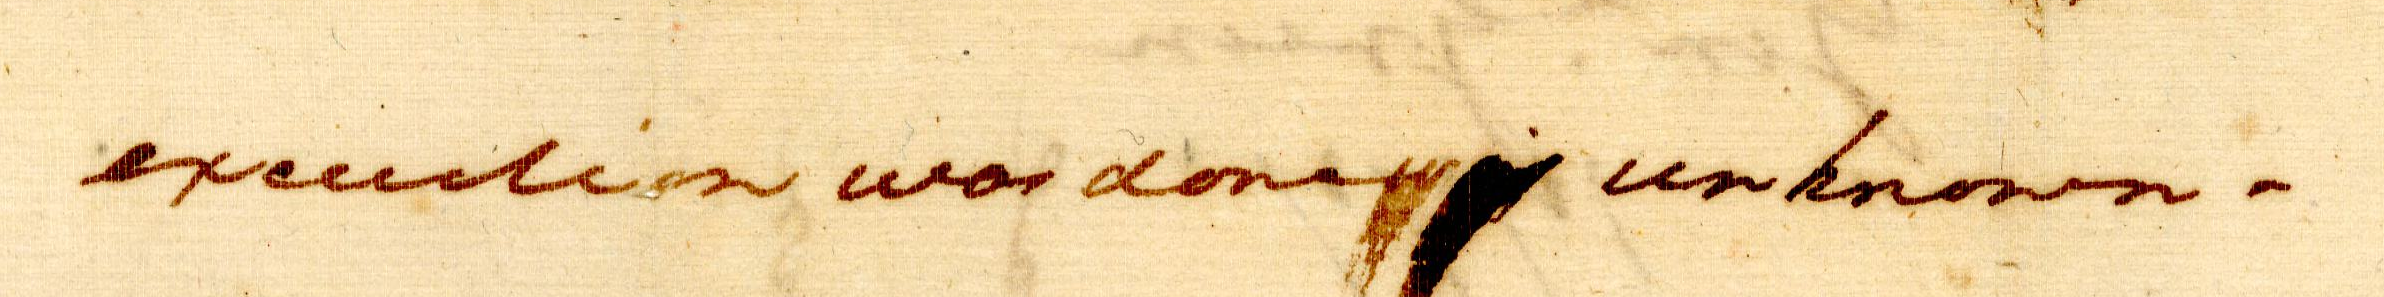execution was done [is] unknown.
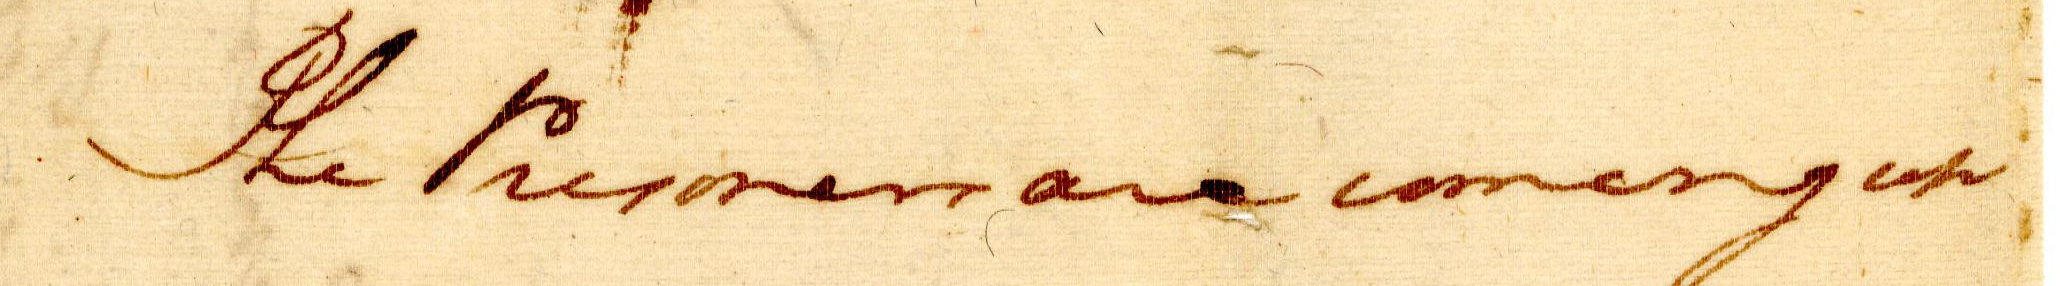The Prisoners are coming up
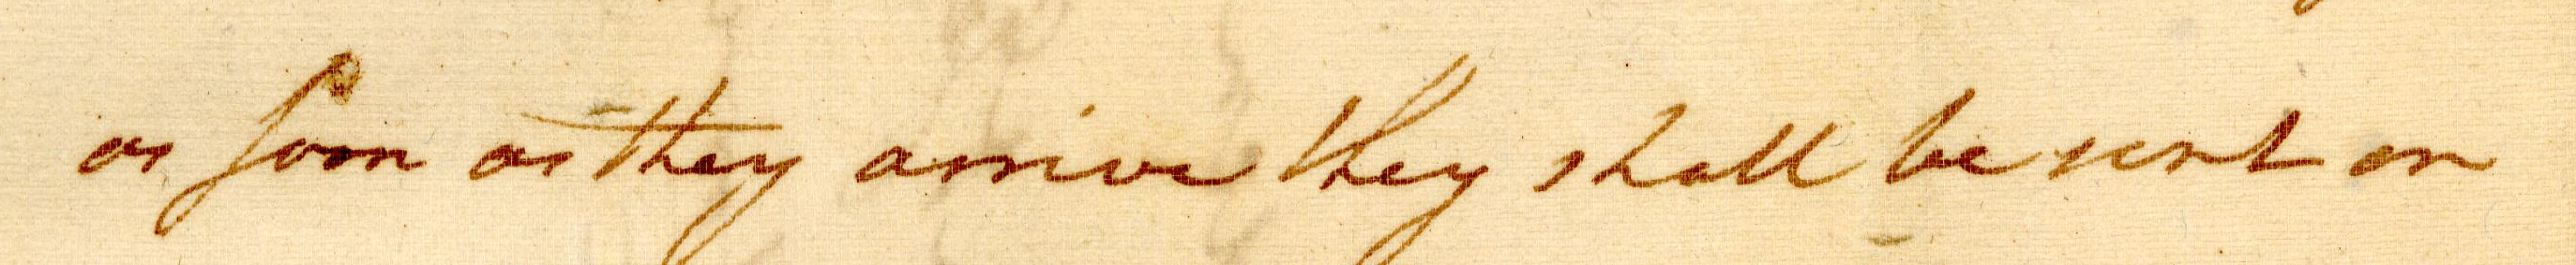as soon as they arrive they shall be sent on
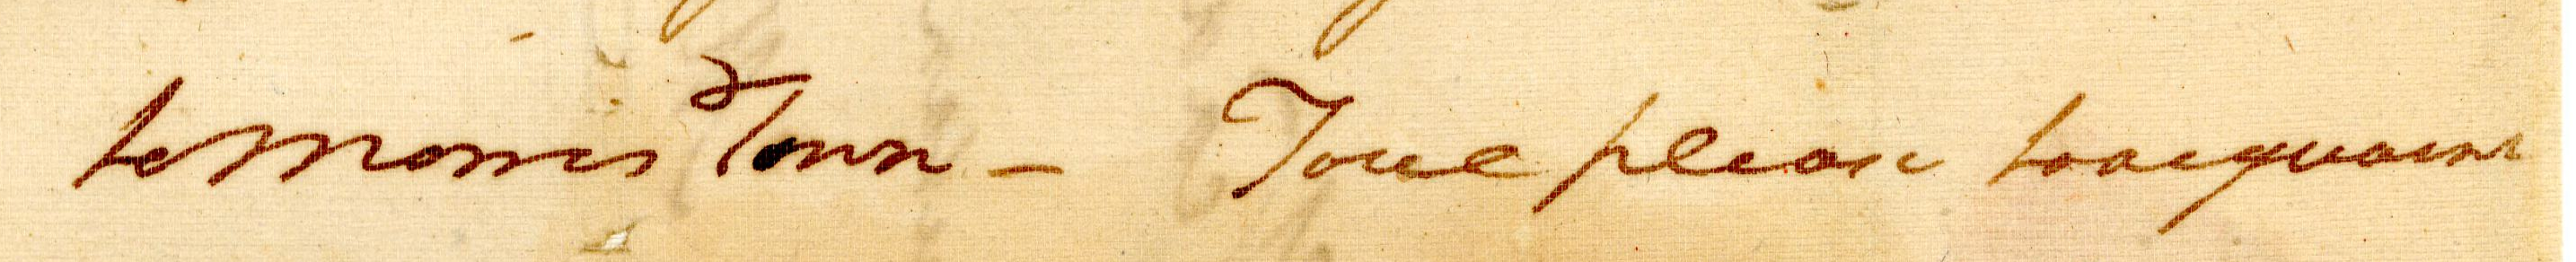to Morris Town- Youl please to acquaint
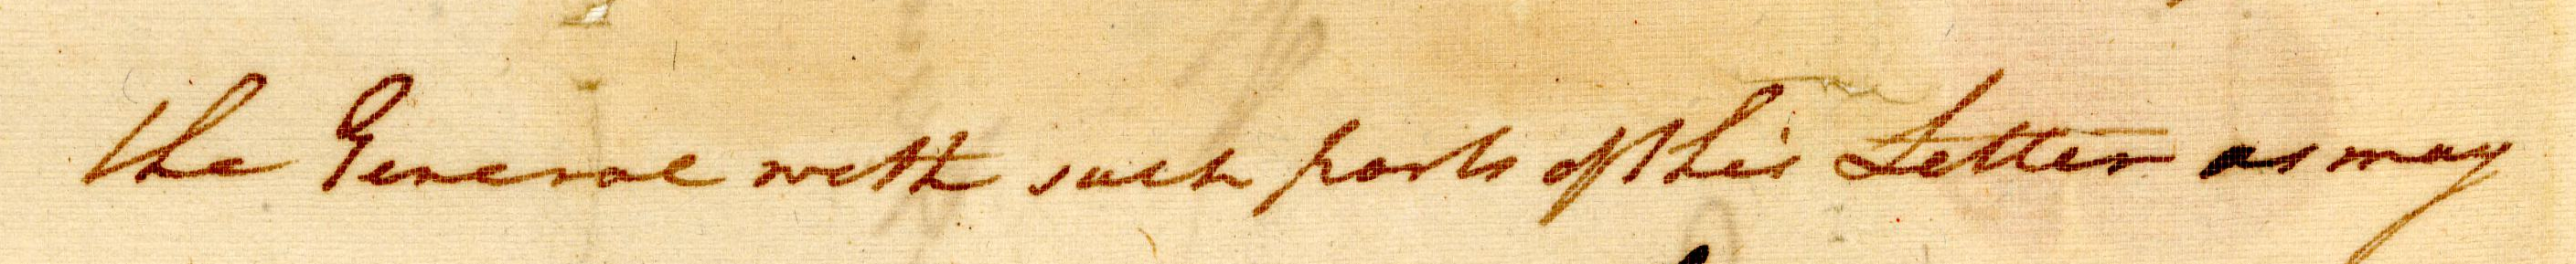the General with such parts of this Letter as may
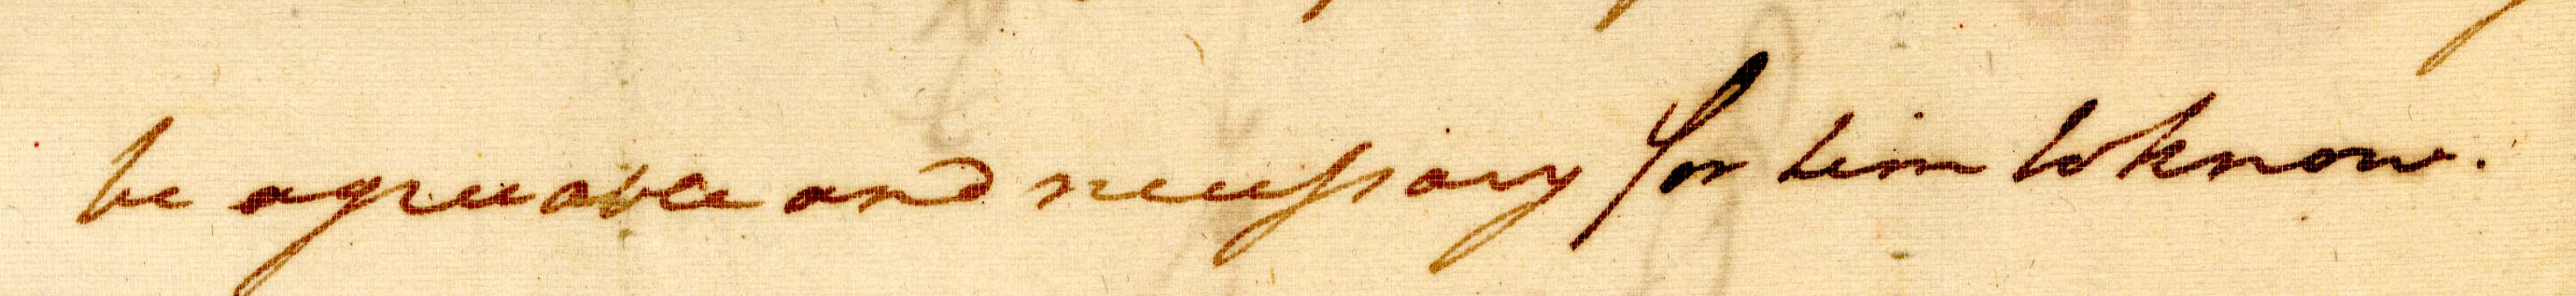be agreeable and necessary for him to know.
